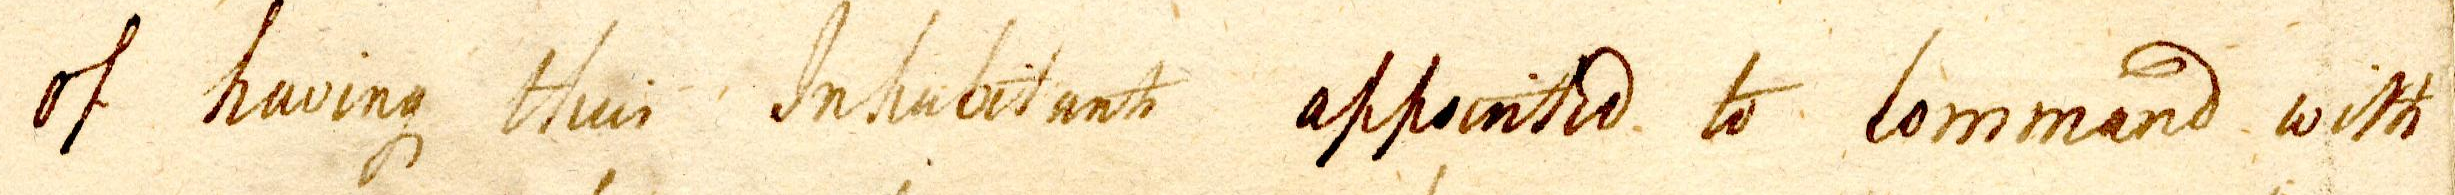of having their Inhabitants appointed to Command with
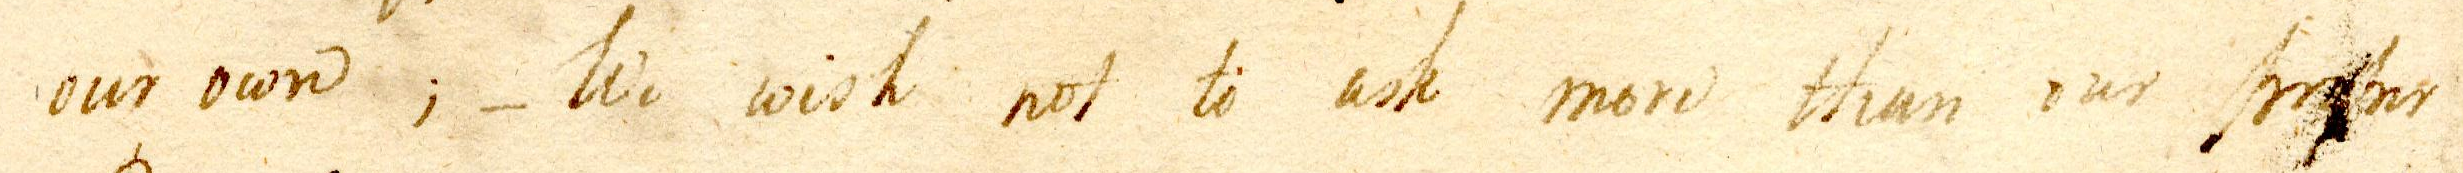our own; We wish not to ask more than our proper
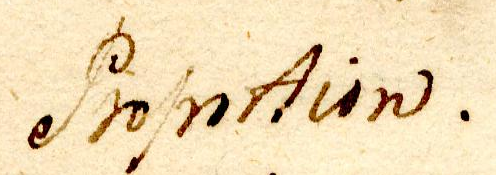Proportion
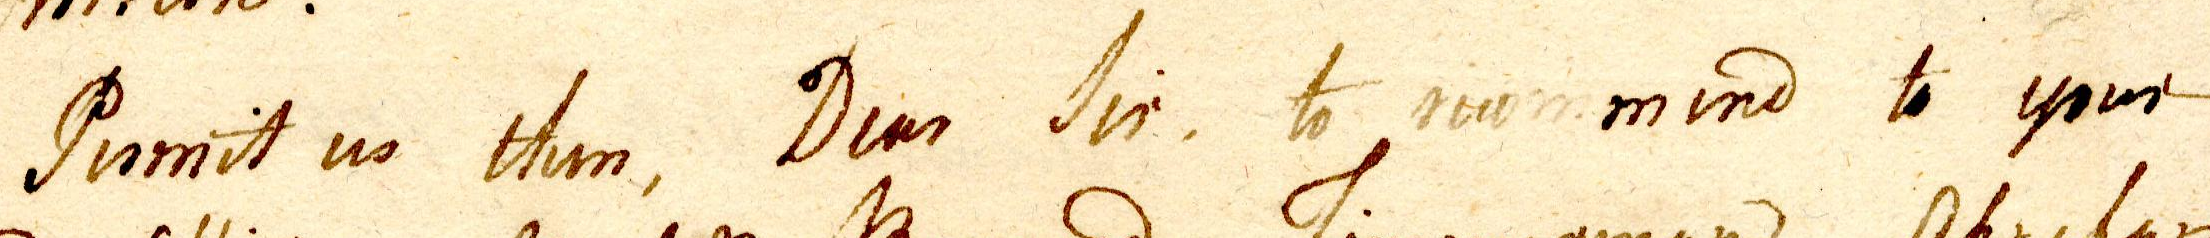Permit us then, Dear Sir, to recommend to your
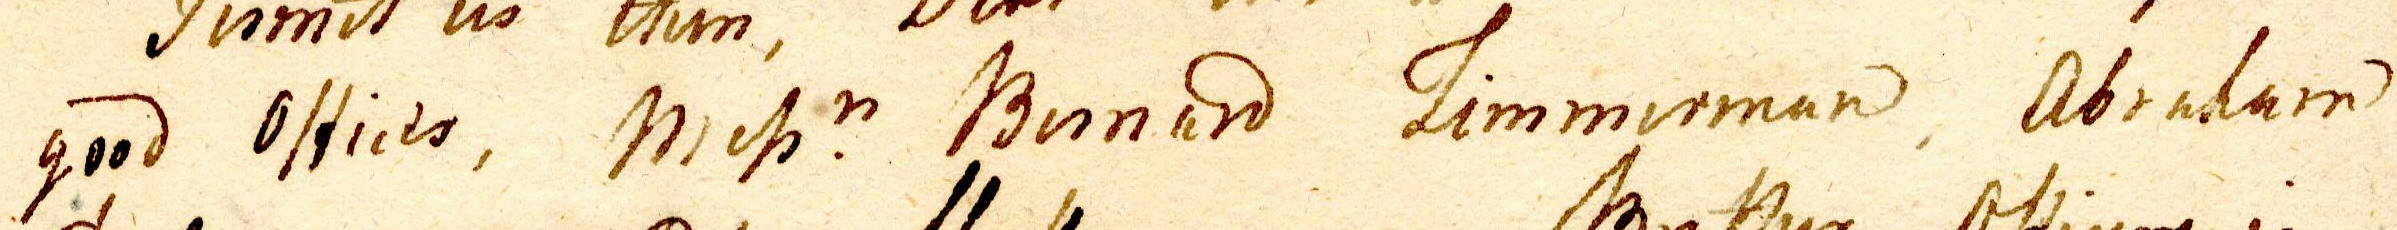good Offices, Mess^r. Bennard Timmerman Abraham
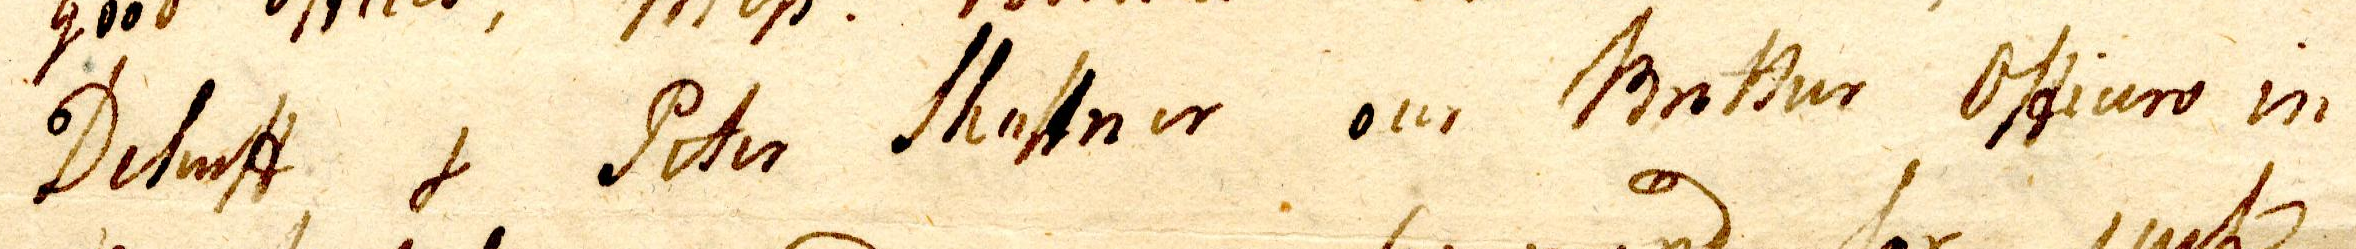Desuff & Peter Shaffner our Brother Officers in
